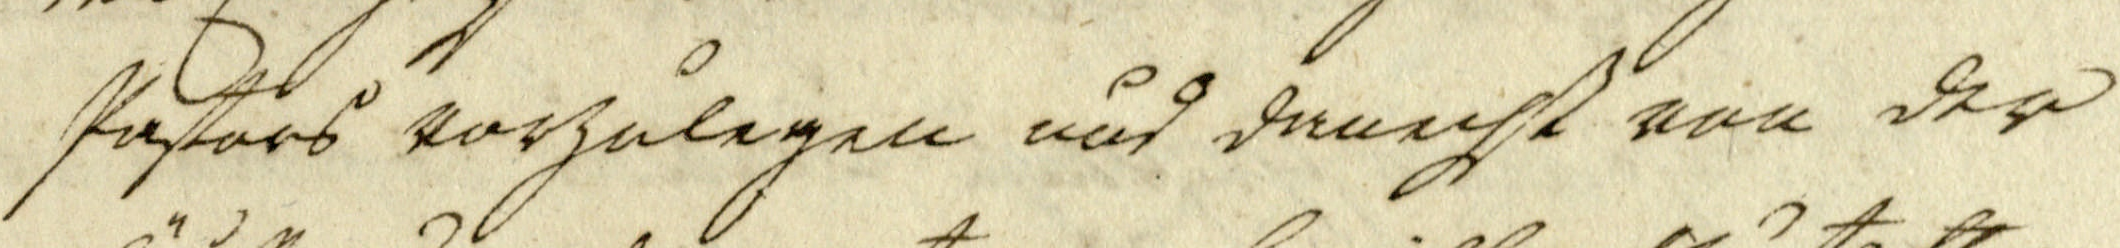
Pastors vorzulegen und danechst von der
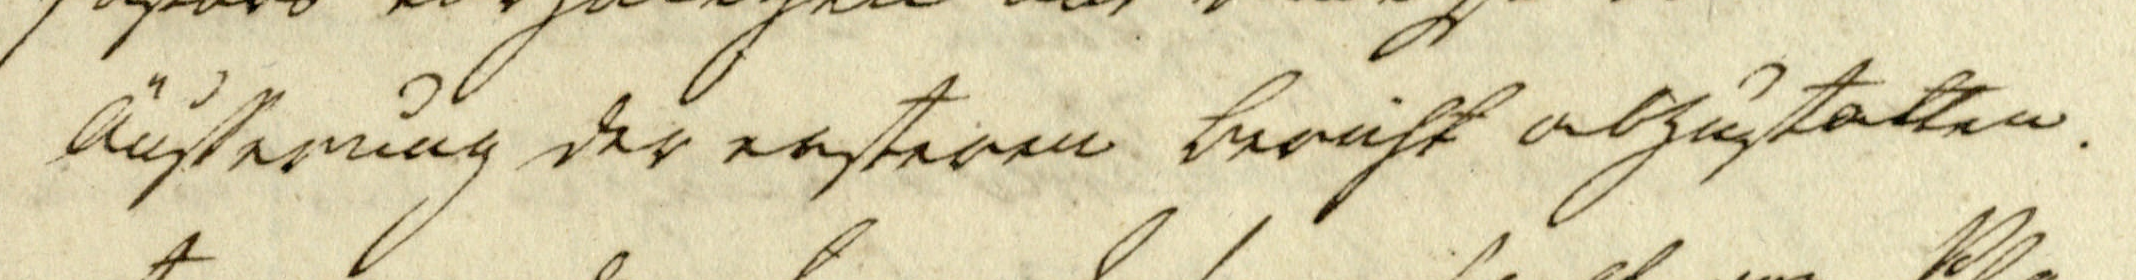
Äusserung der ersteren Bericht abzustatten.
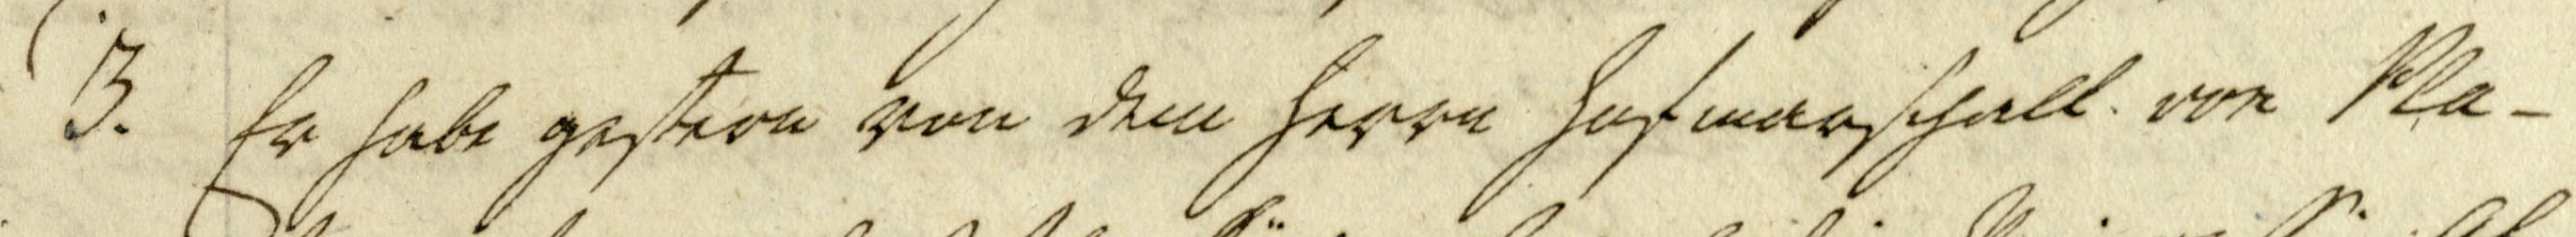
3. Er habe gestern von dem Herrn Hofmarschall von Pla¬
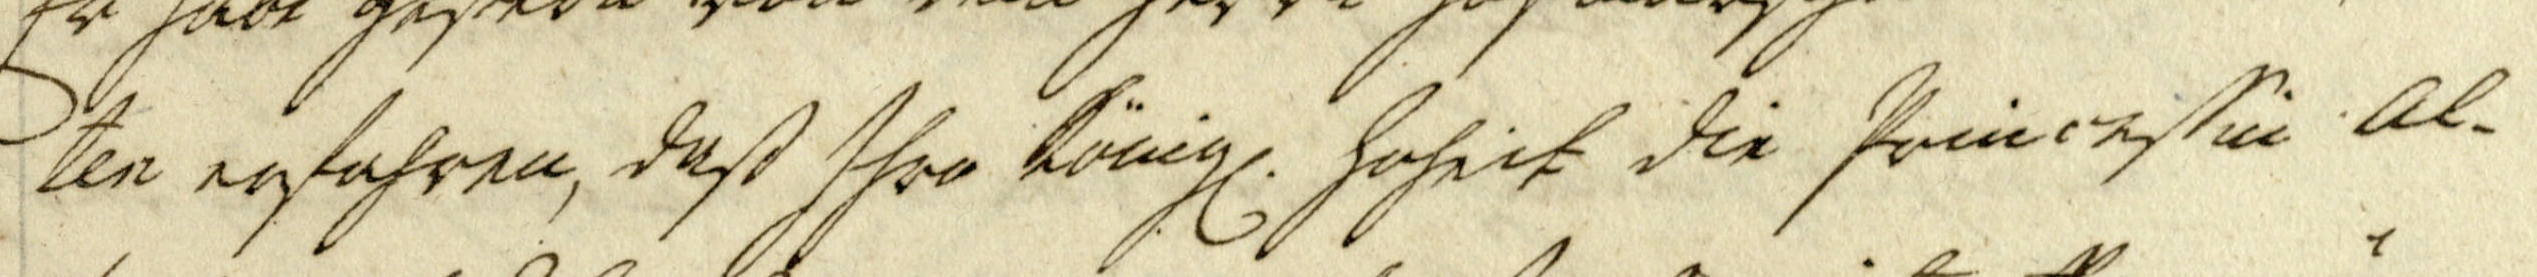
ten erfahren, daß Ihre Königl. Hoheit die Princessin Al¬
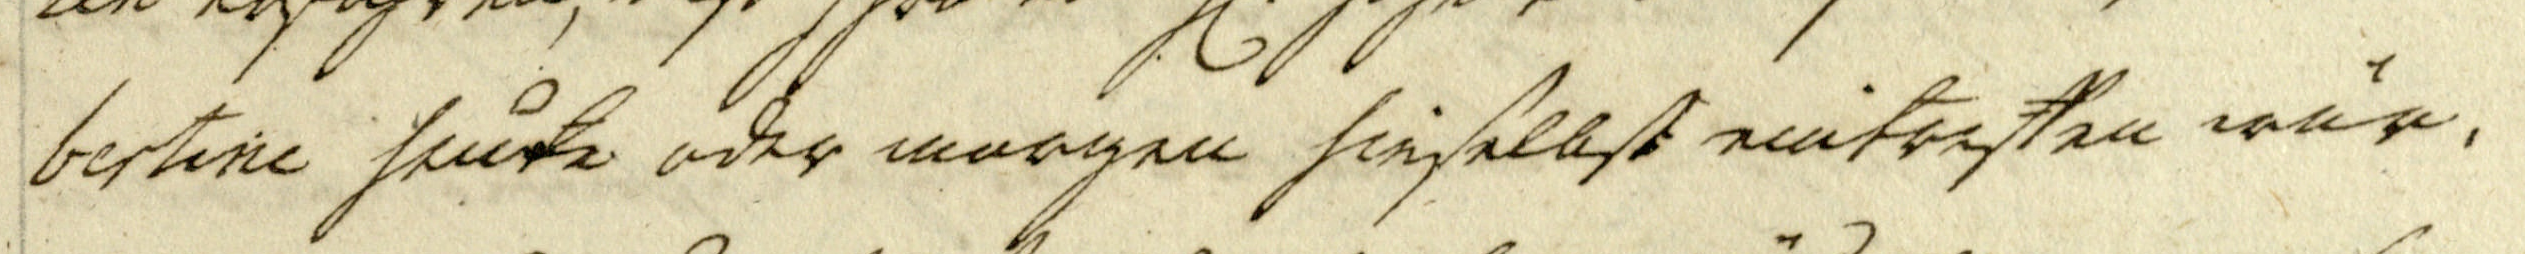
bertine heute oder morgen hieselbst eintreffen wür¬
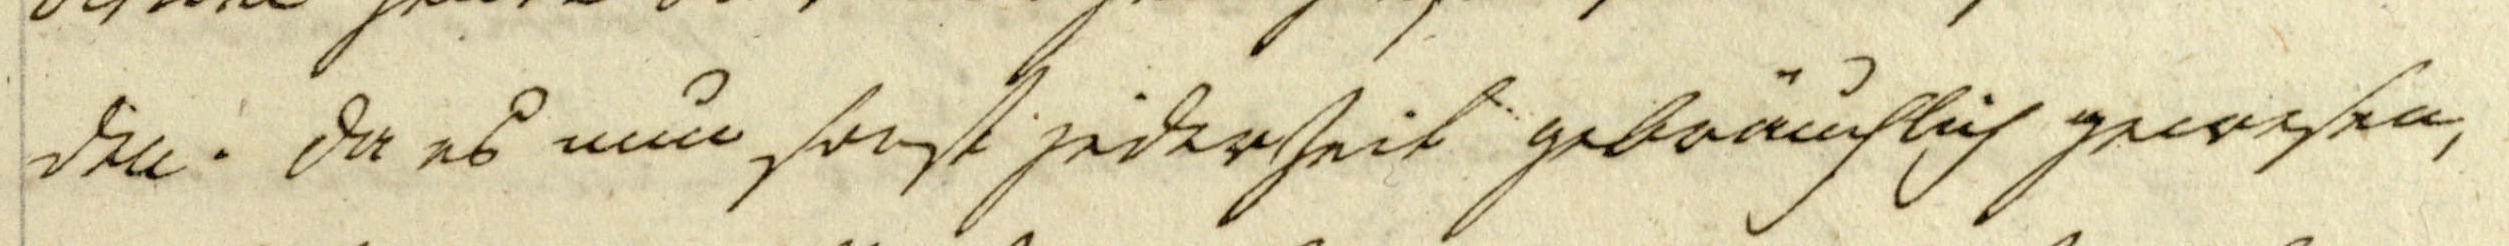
den. da es nun sonst jederzeit gebräuchlich gewesen,
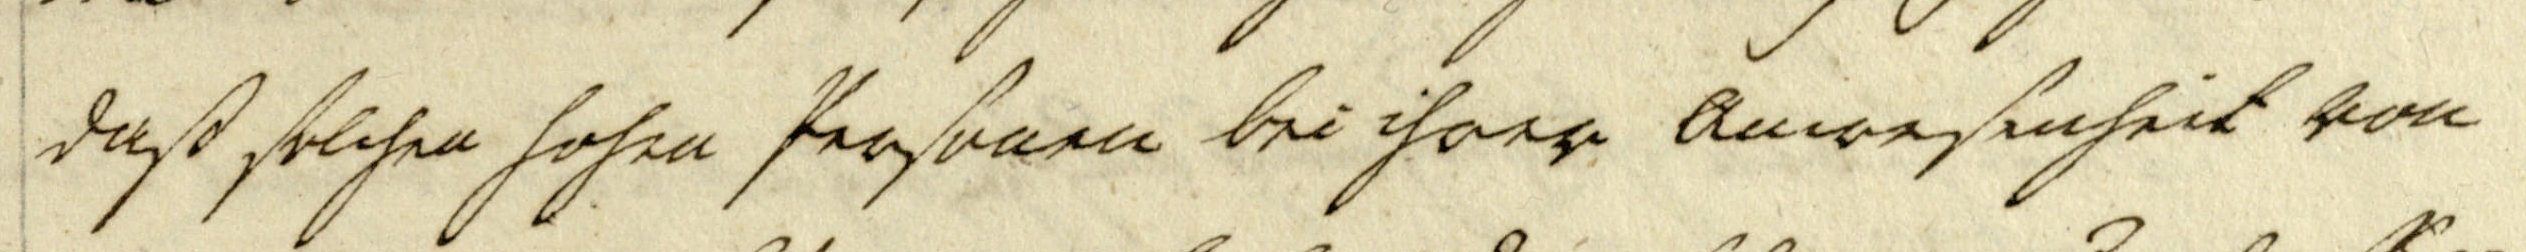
daß solchen hohen Personen bei ihrer Anwesenheit von
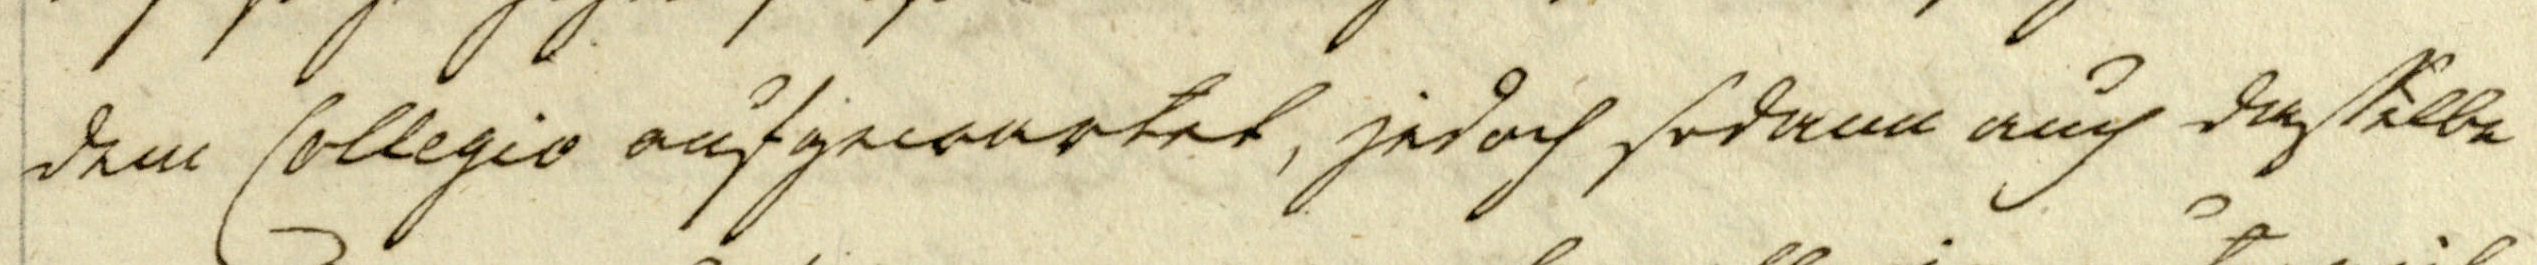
dem Collegio aufgewartet, jedoch sodann auch dasselbe
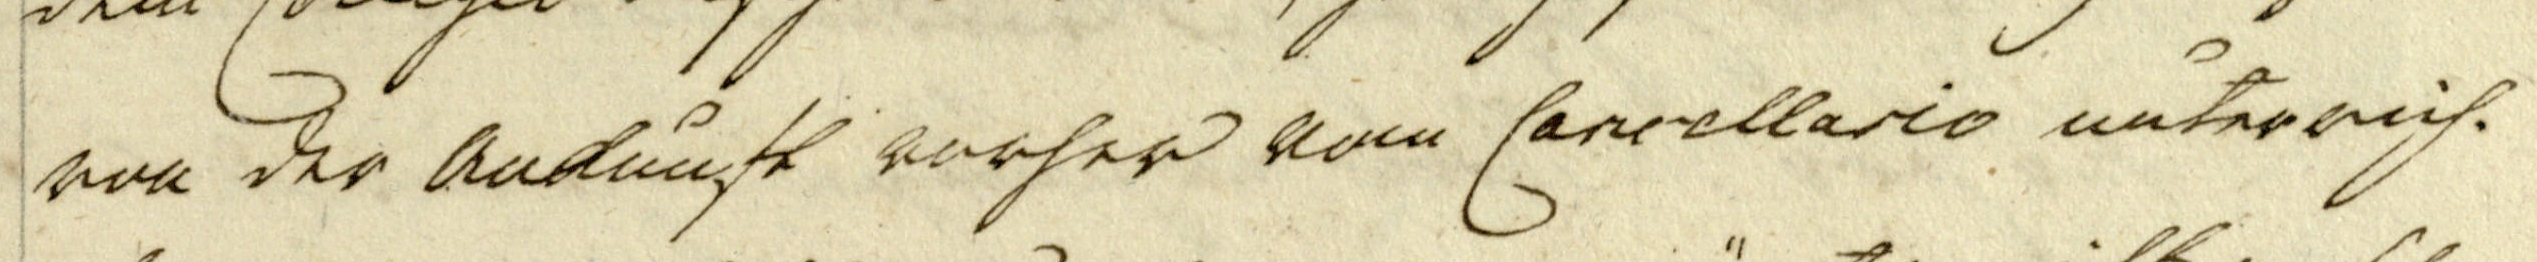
von der Ankunft vorher vom Cancellario unterrich¬
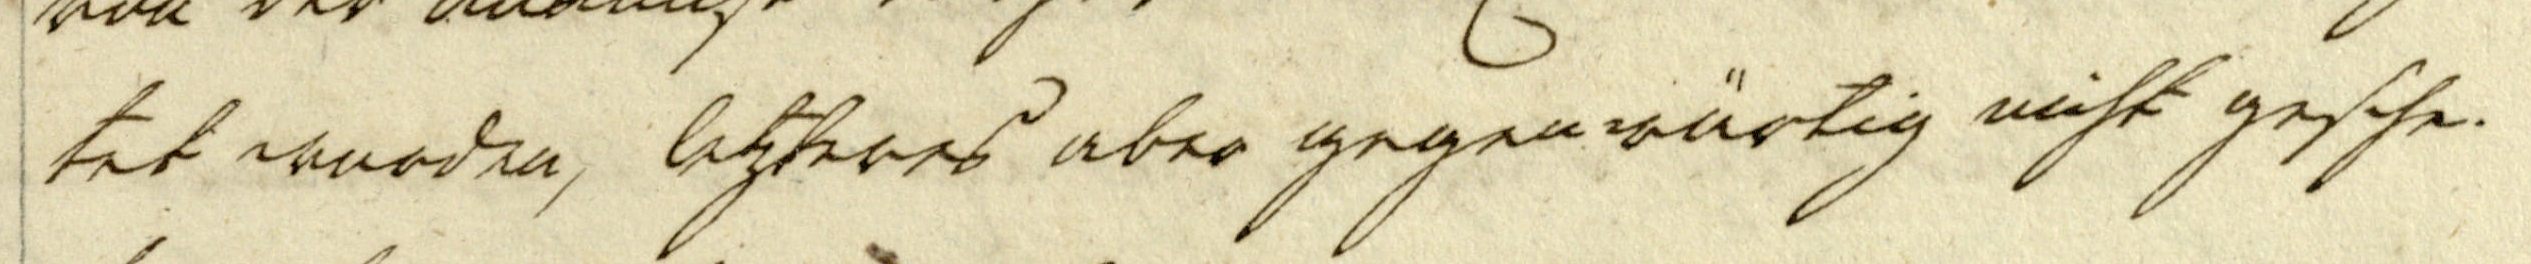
tet worden, letzteres aber gegenwärtig nicht gesche¬
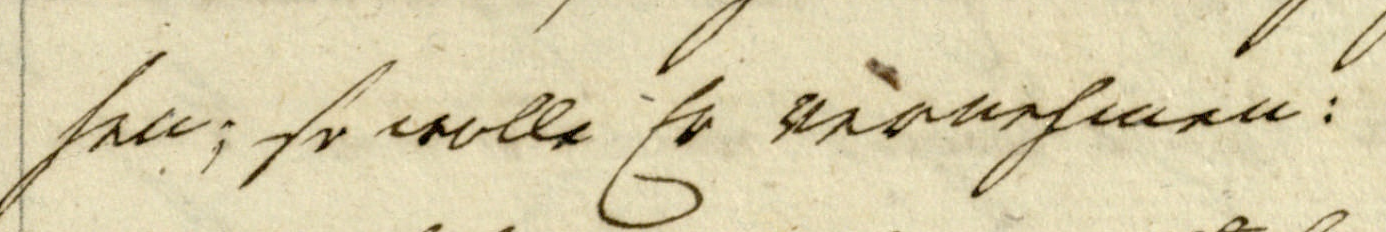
hen; so wolle Er vernehmen:
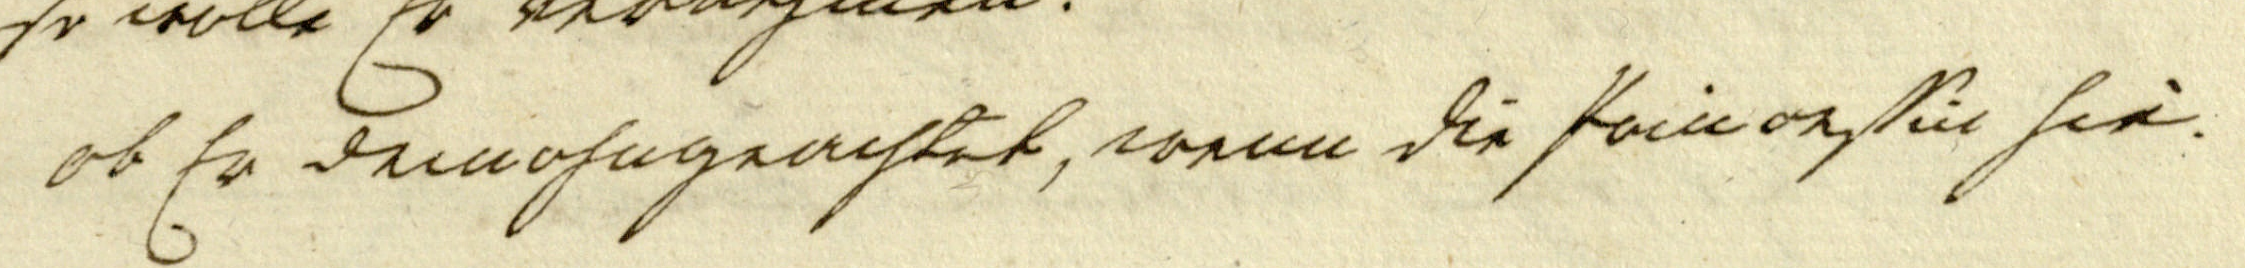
ob Er demohngeachtet, wenn die Princessin hie¬
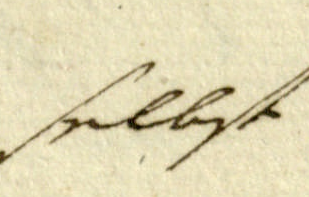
selbst
